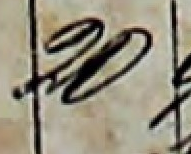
20
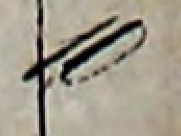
10
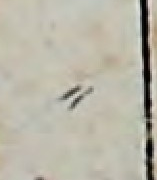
„
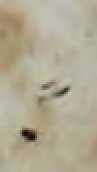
„
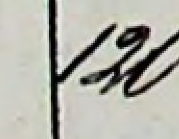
120
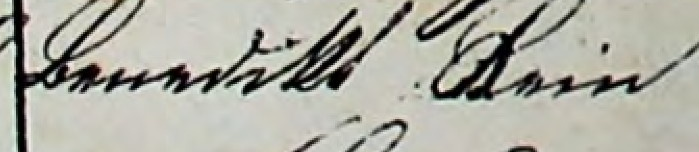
Benedikt Kein
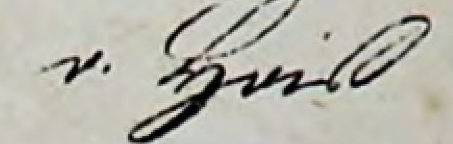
v. Hois
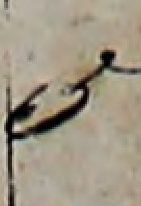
5
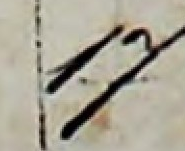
17
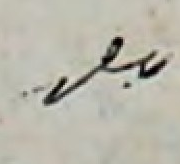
do
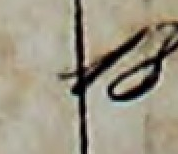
18
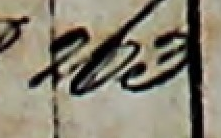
263
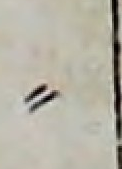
„
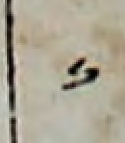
„
